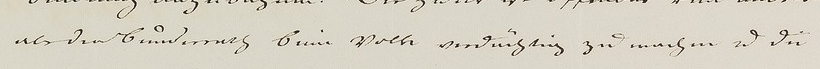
als den Bundesrath beim Volke verdächtig zu machen u die
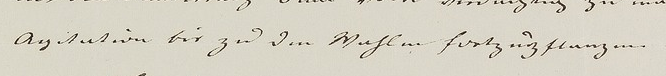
Agitation bis zu den Wahlen fortzupflanzen. –
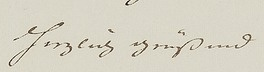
Herzlich grüßend
